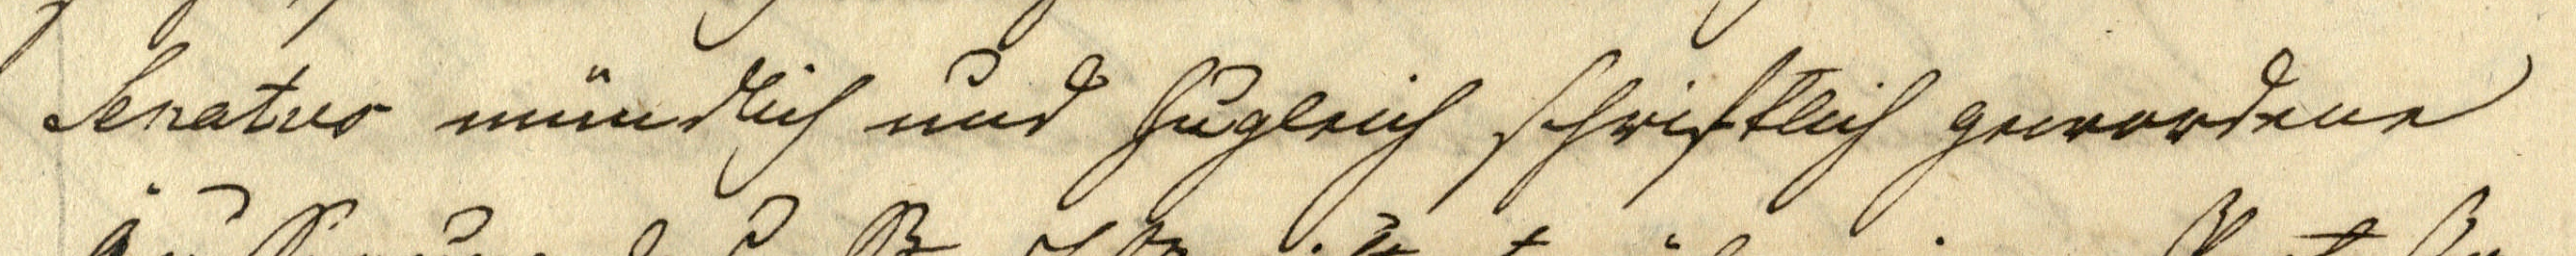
Senatus mündlich und zugleich schriftlich gewordene
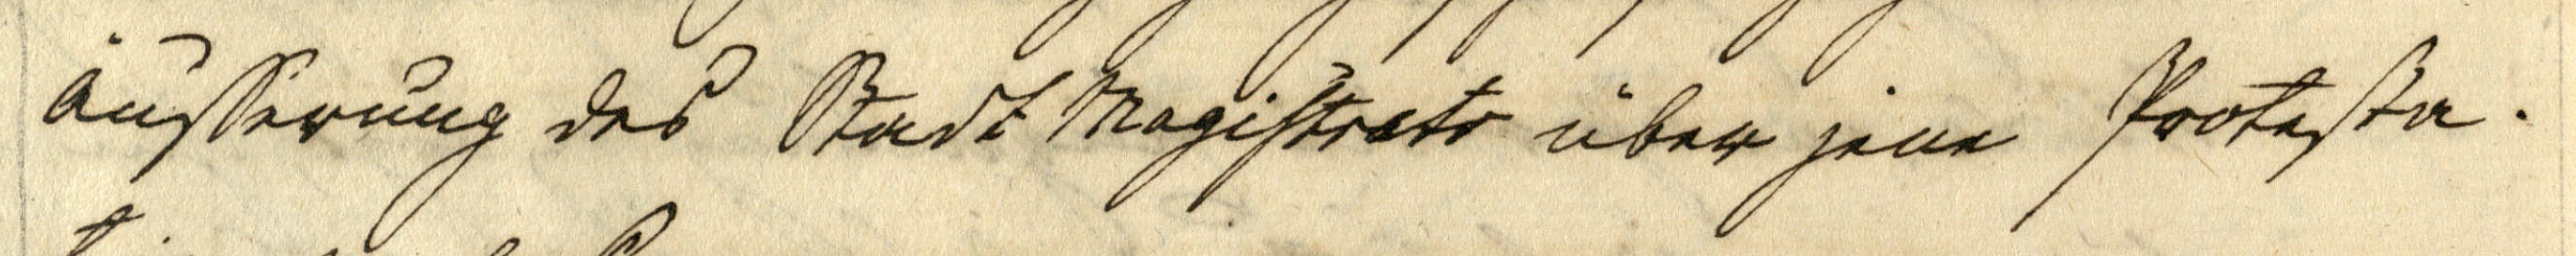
Äusserung des Stadt Magistrats über jene Protesta-
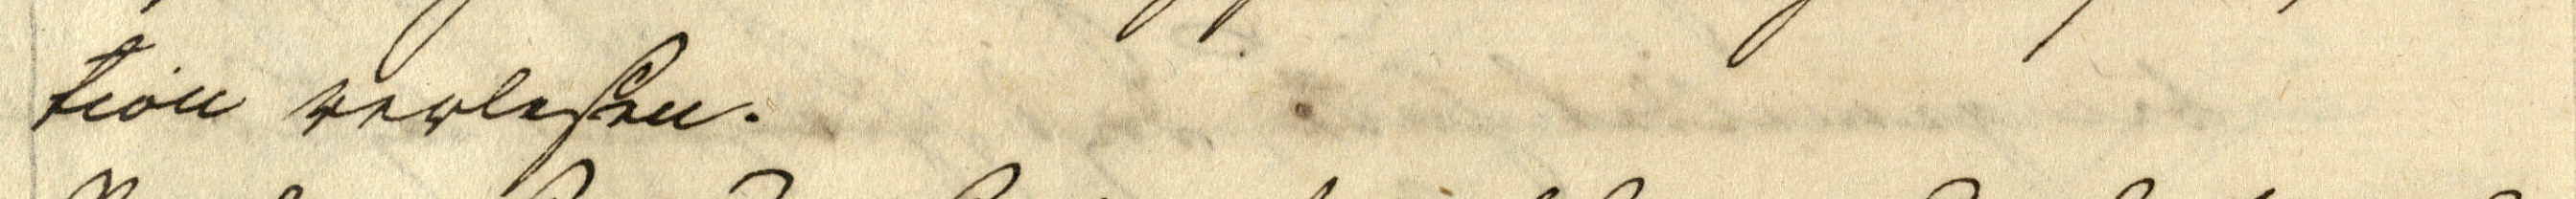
tion verlesen.
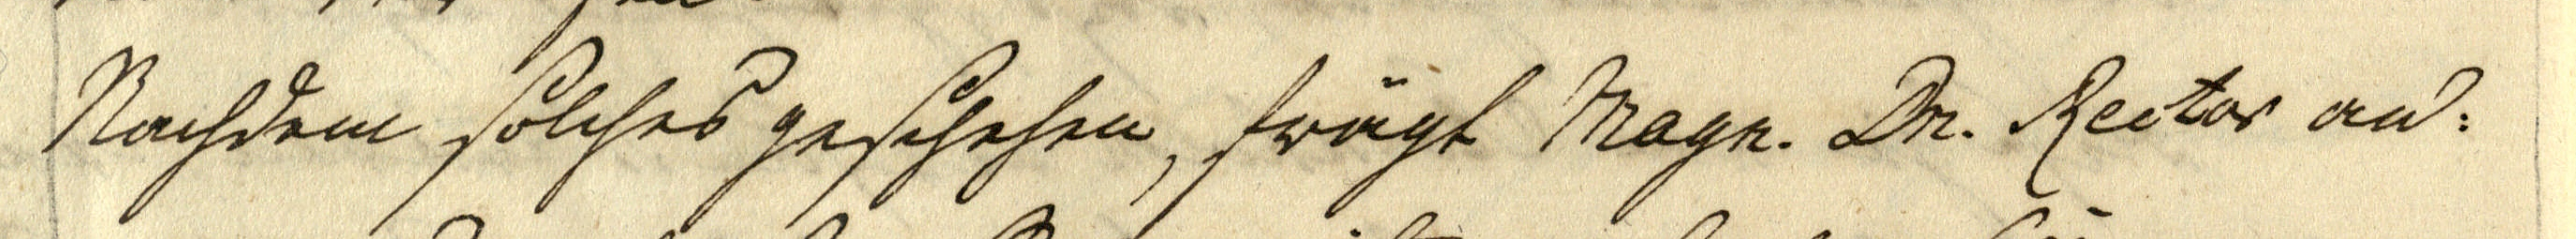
Nachdem solches geschehen, frägt Magn. Dn. Rector an:
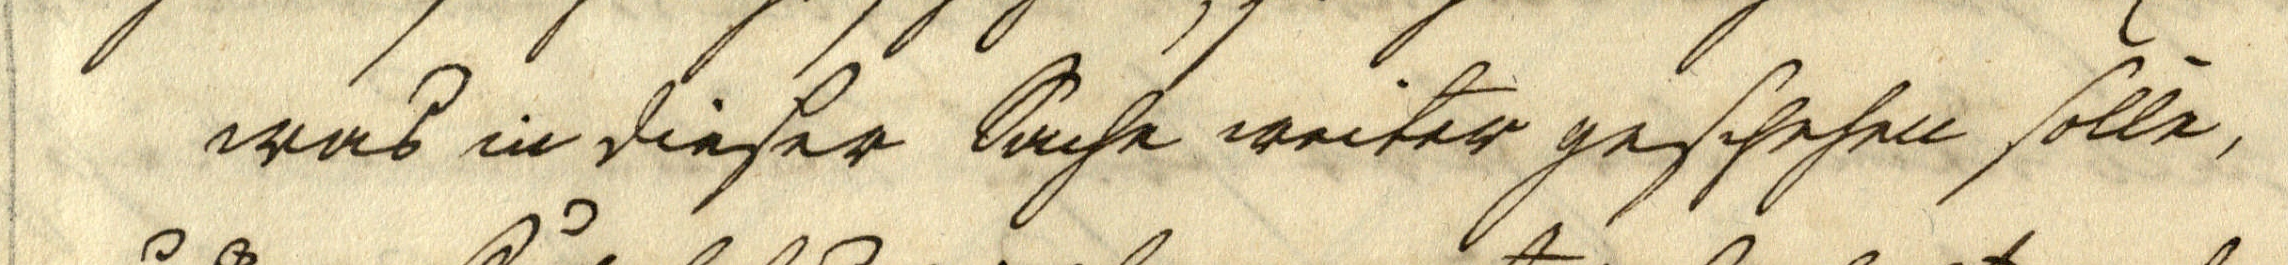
was in dieser Sache weiter geschehen solle,
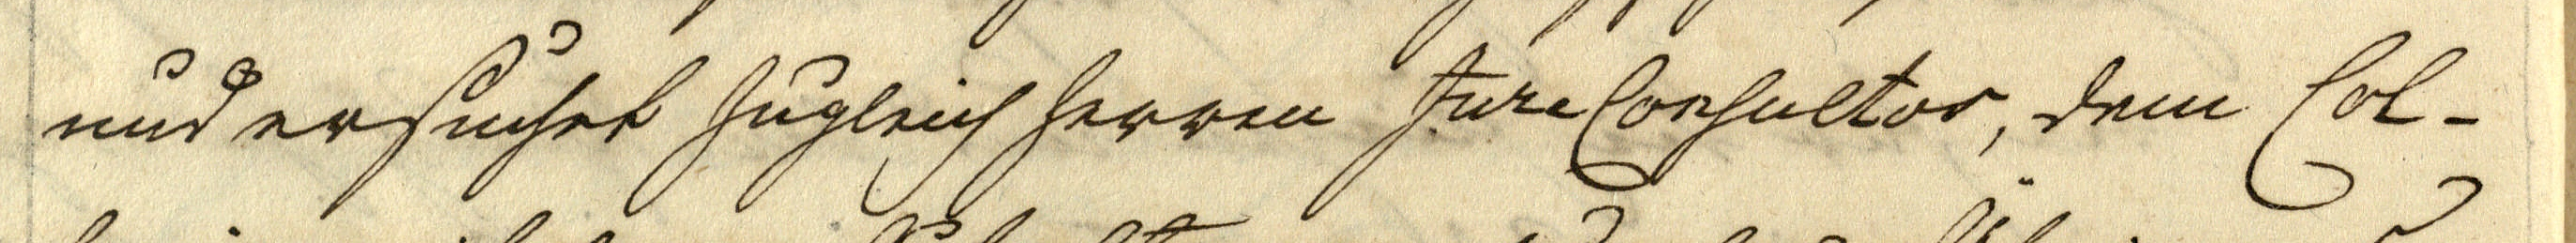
und ersuchet zugleich Herren JureConsultos, dem Col-
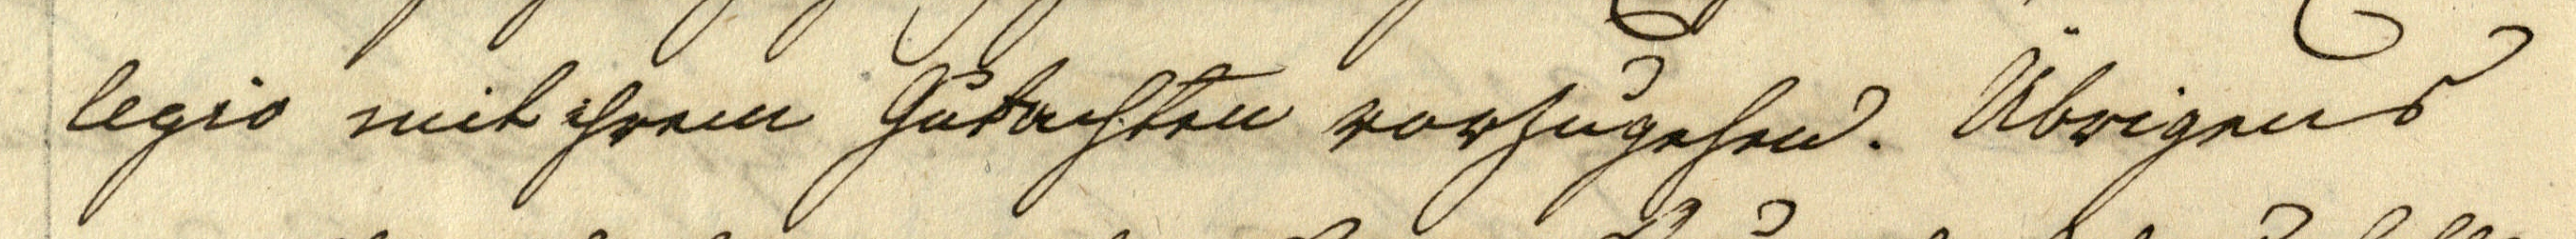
legio mit ihrem Gutachten vorzugehen. Übrigens
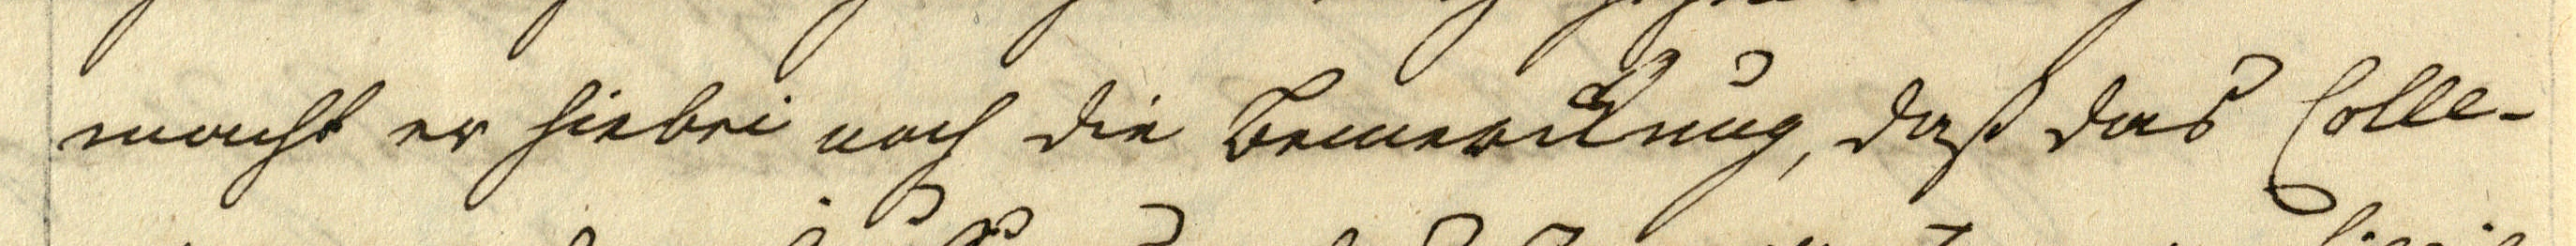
macht er hiebei noch die Bemerkung, daß das Colle-
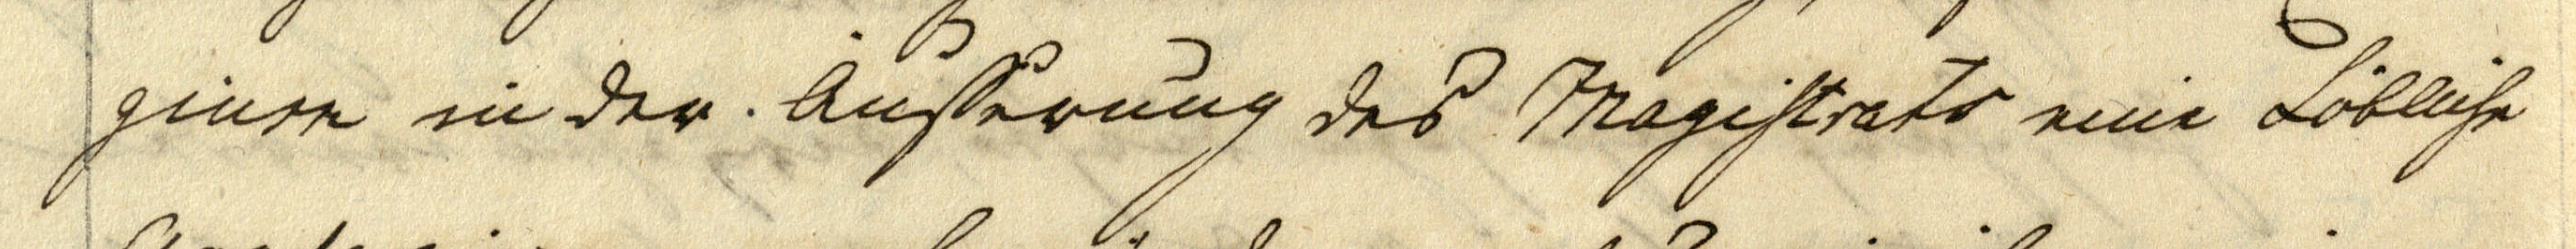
gium in der Äusserung des Magistrats eine Löbliche
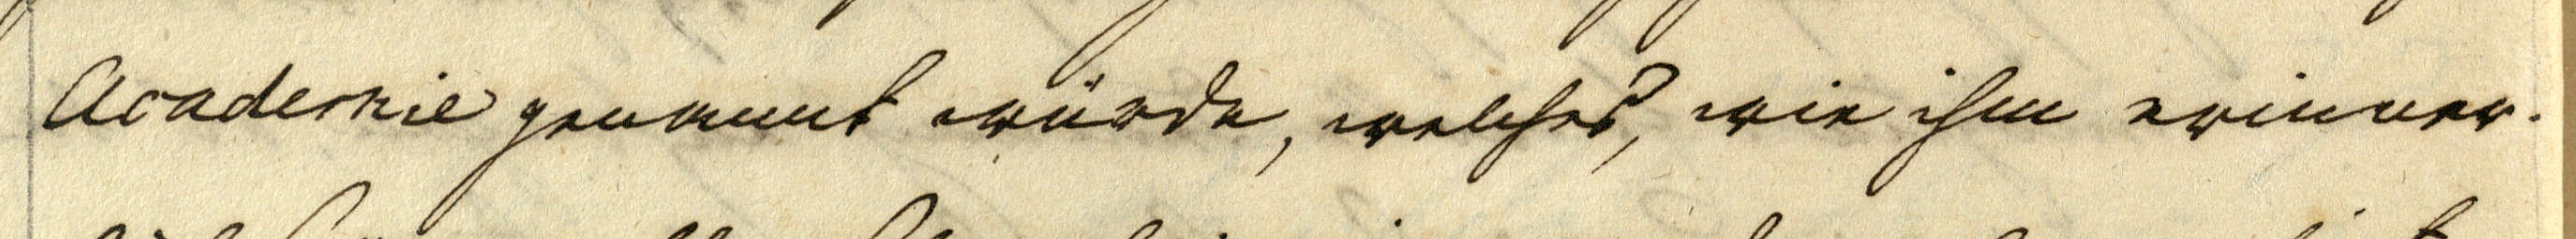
Academie genant würde, welches, wie ihm erinner-
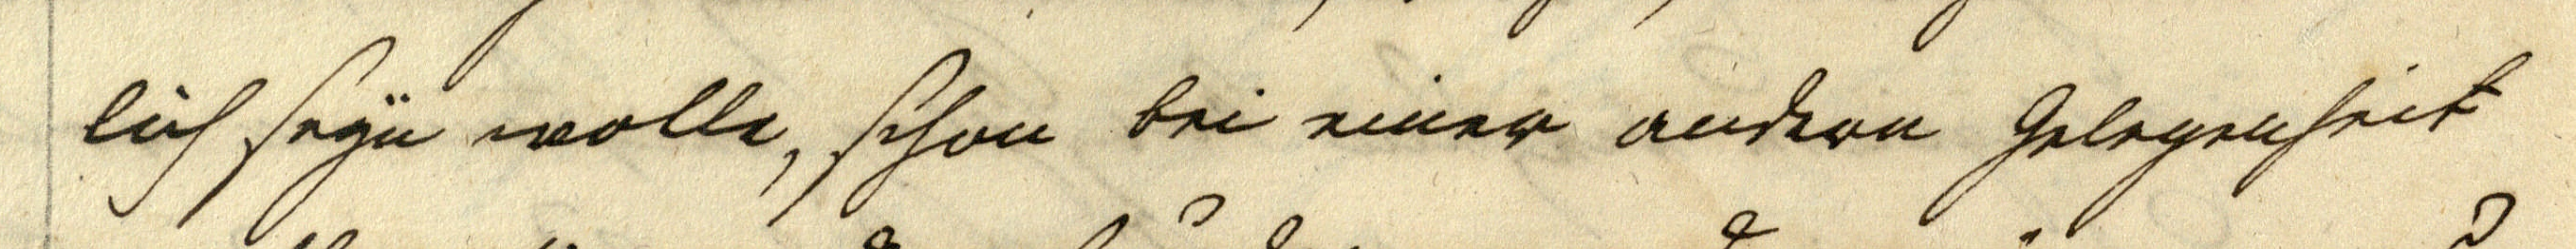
lich seyn wolle, schon bei einer andern Gelegenheit
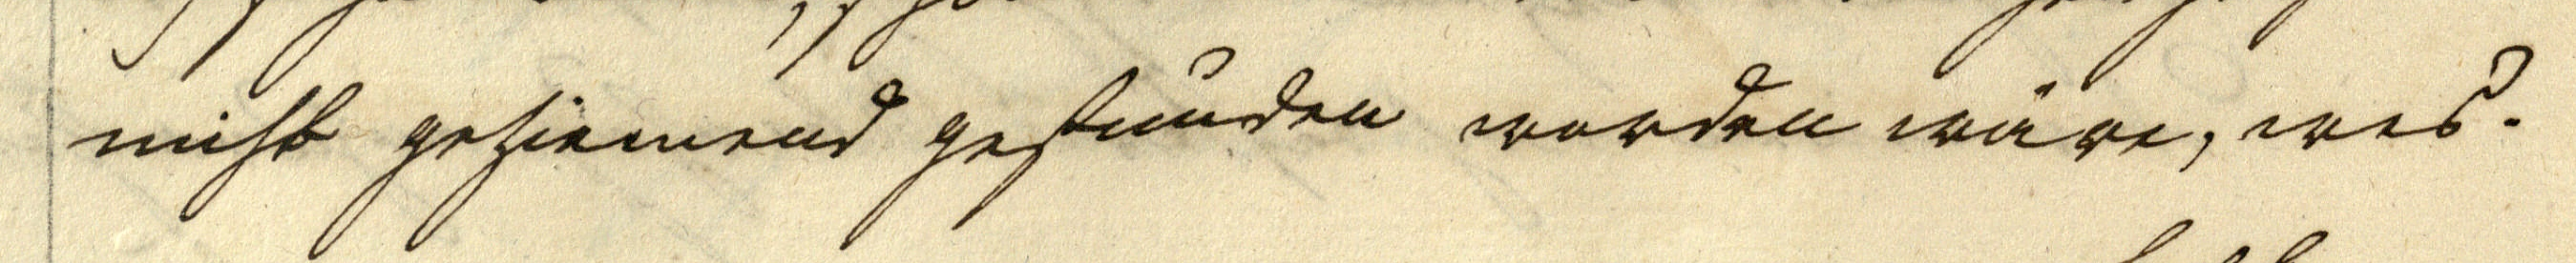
nicht geziemend gefunden worden wäre, wes-
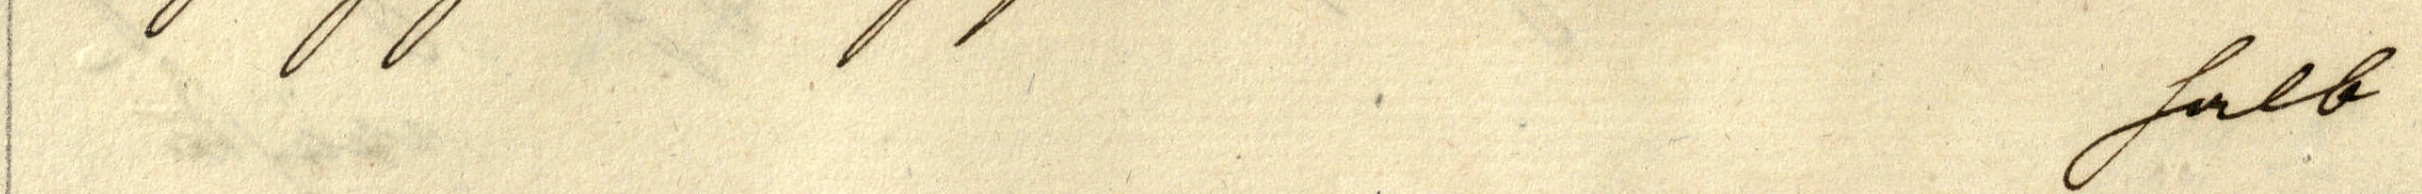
halb
